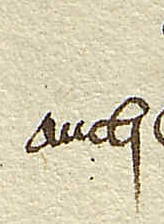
auch
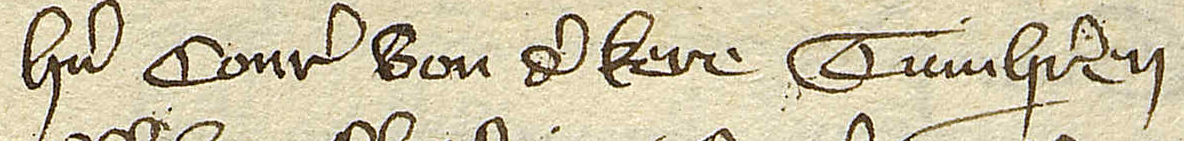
hn* Conr* von d* kere Tumhr*en
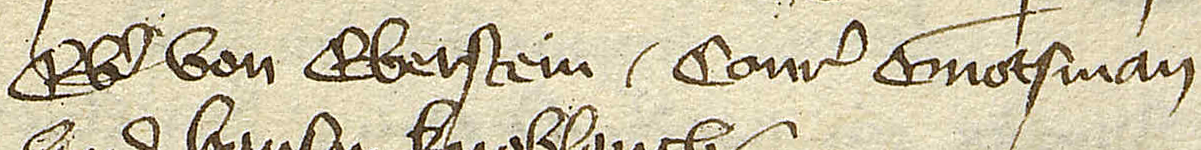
Eb* von Eberſtein / Conr* Gnotſman
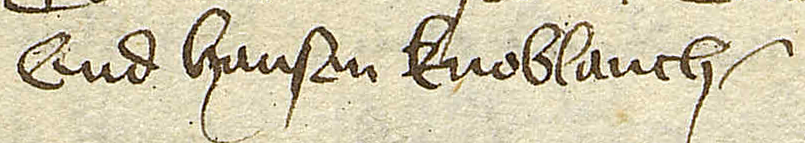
vnd hanſen Knoblauch /
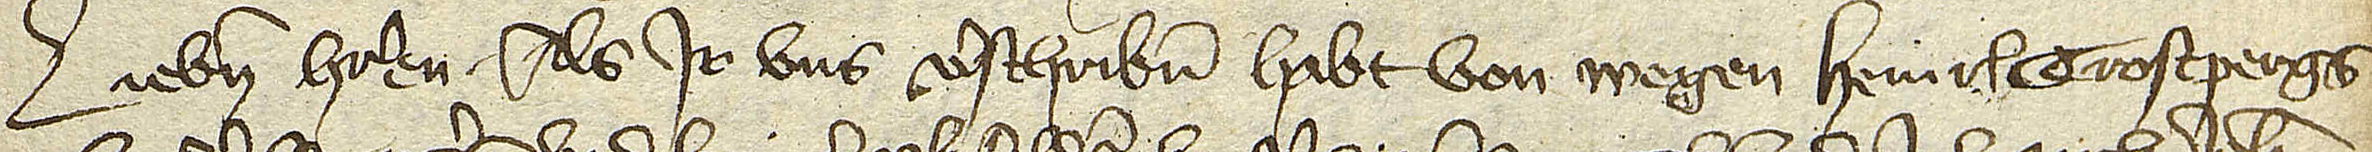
Liebn* hr*en / Als Ir vns v*ſchribn* habt von wegen heinr* Troſtpergs
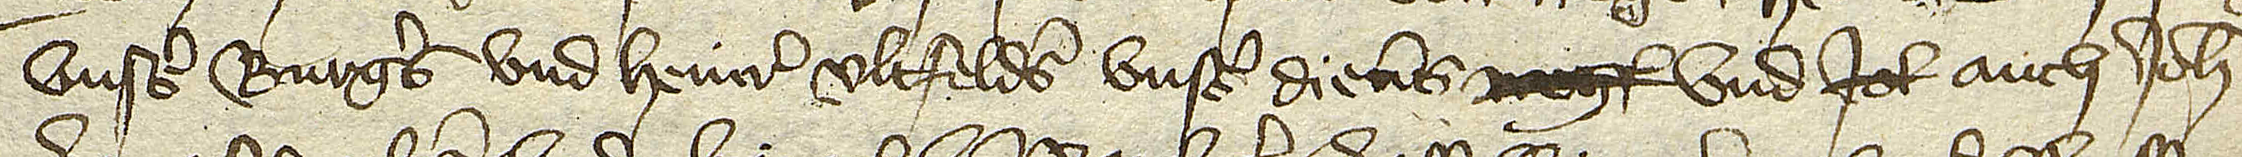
vnſs* Burg*s vnd heinr* vltfelds* vnſs* dien*s weg* vnd Ioh auch Ioh*
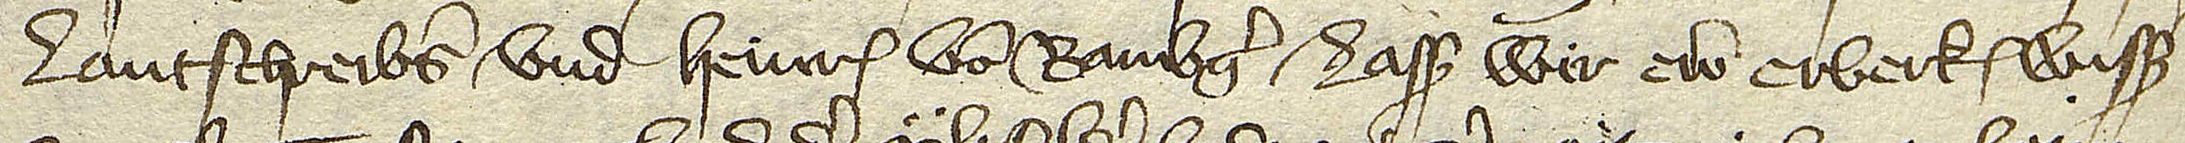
Lantſchreibs* / vnd heinr* vo* Bambg* / Laſſ* wir ew* erberk* wiſſ*
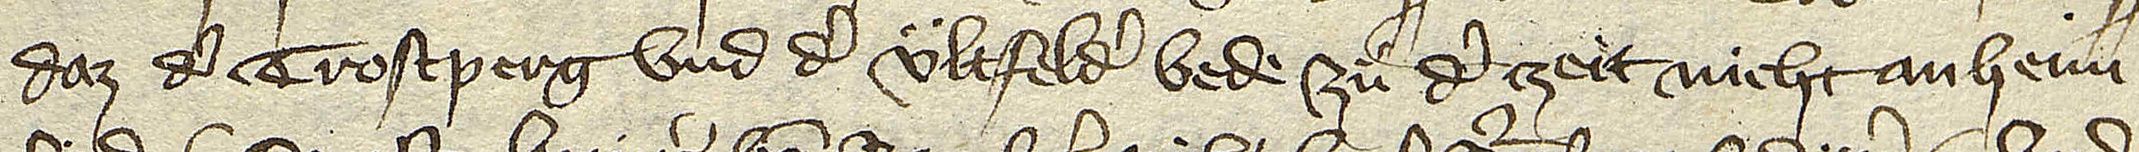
daʒ d* Troſtperg vnd d* ltfelds* bede cʒü d* cʒeit nicht anheim
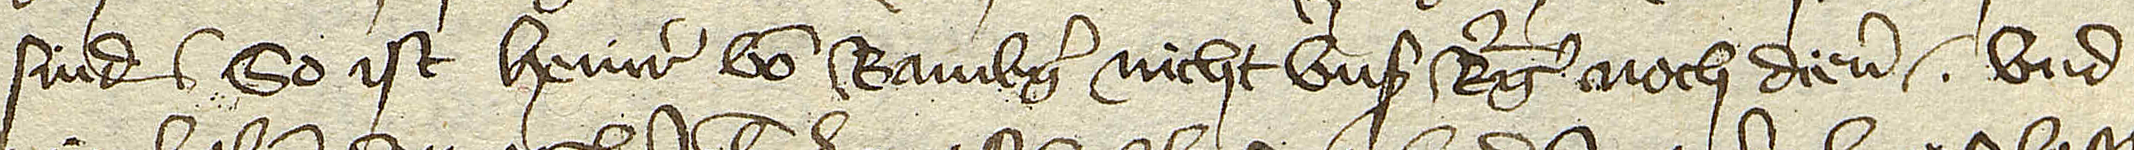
ſind / So iſt heinr* vo* Bambg* nicht vnſ* B*g* noch dien* / . vnd
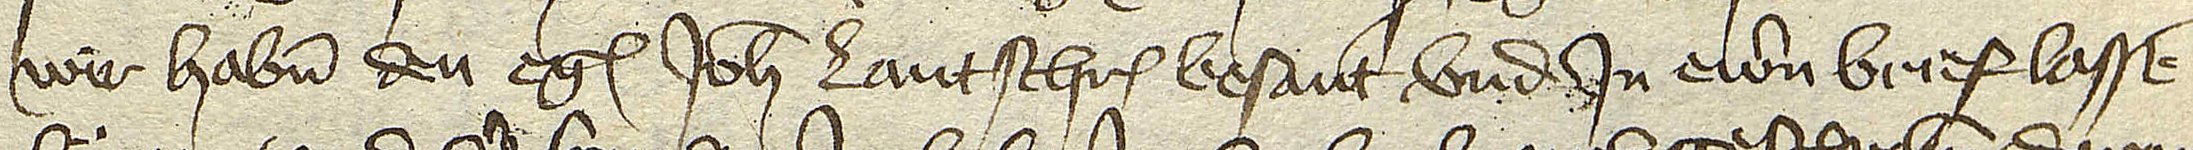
wir habn* den eg* Ioh* Lantſchr* beſant / vnd In ew*n brief laſſe*
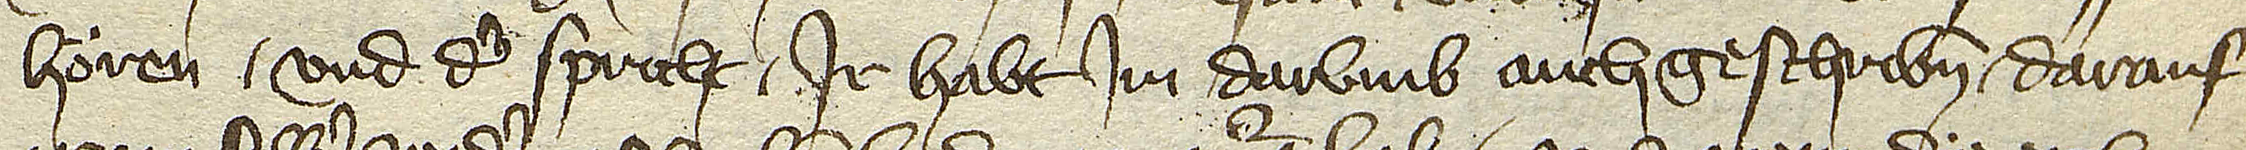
hören / vnd d* ſpricht / Ir habt Im darvmb auch geſchribn* / darauf
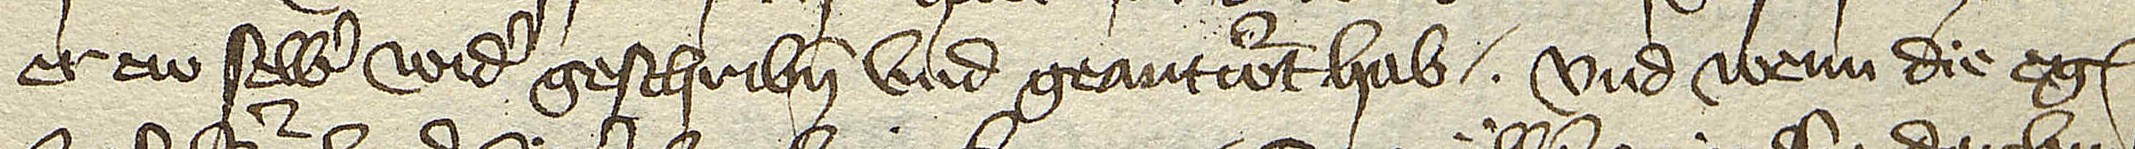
er ew ſelb* wid* geſchribn* vnd geantw*t hab / . vnd wenn die eg*
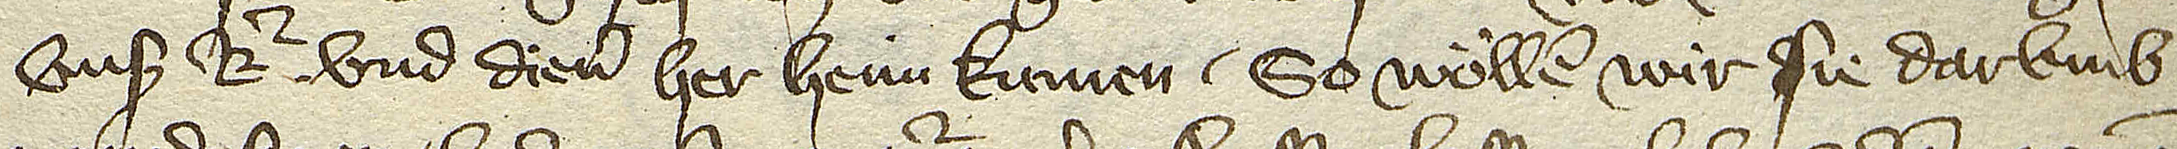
vnſ* B* vnd dien* her heim kumen / So wölle* wir ſie darvmb
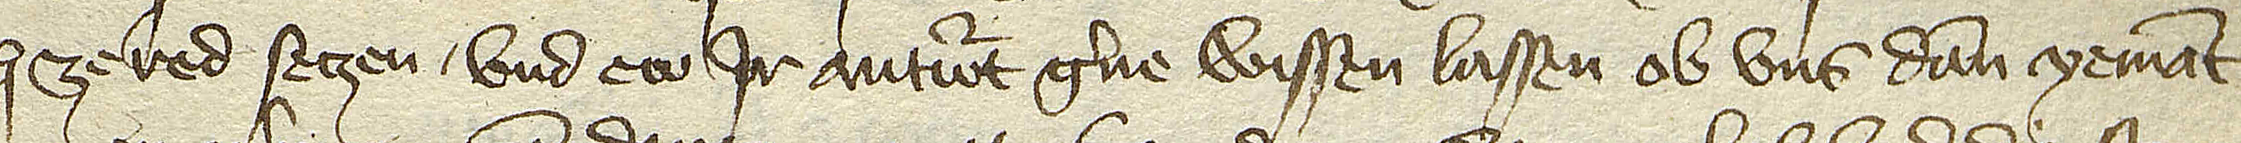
cʒe red ſecʒen / vnd ew Ir antw*t g*ne wiſſen laſſen ob vns dan* yemat*
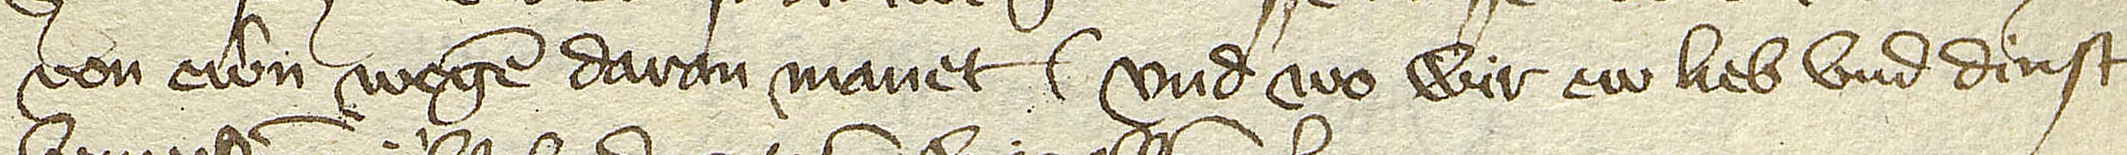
von ew*n wege* daran manet / vnd wo wir ew lieb vnd dinſt
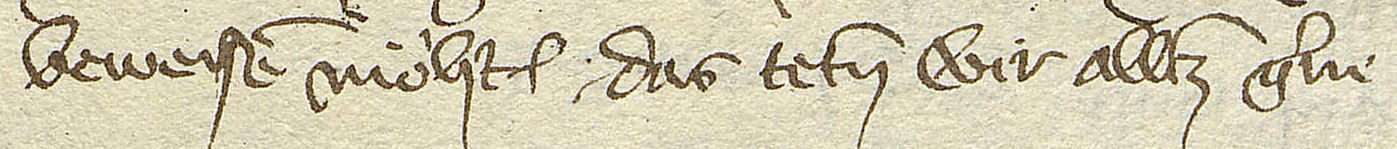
beweiſe* möht* / das tetn* wir allcʒ* g*ne
